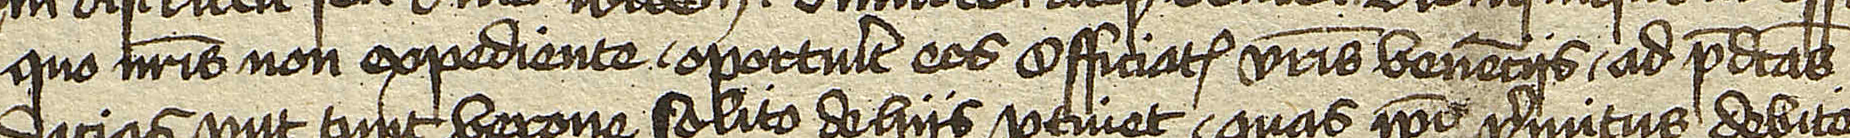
quo n*ris non expediente / oportu*it eos Officiat* v*ris Veneti*is / ad p*d*tas
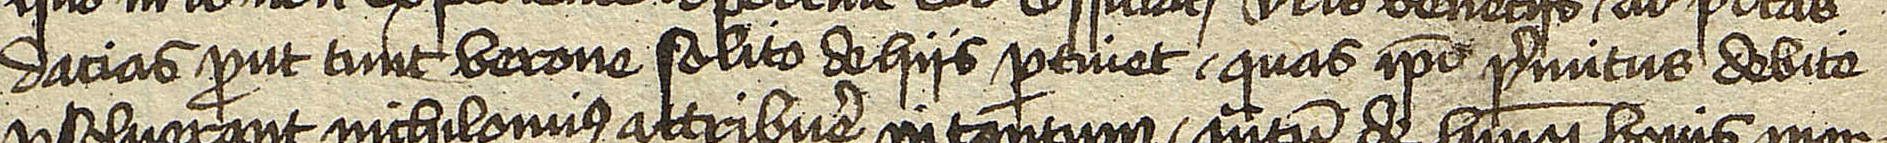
dacias p*ut tunc Verone solito de hiis p*tinet / quas ip*o p*mitus debite
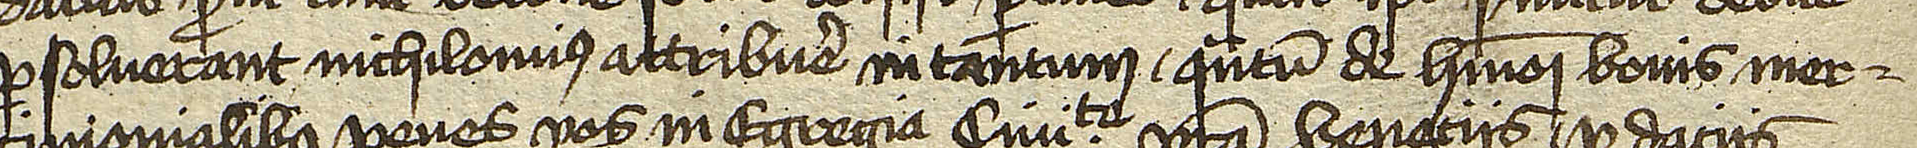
p*ſolverant nichilomi* attribue* in tantum / qua*t* de h*mo*i bonis mer =
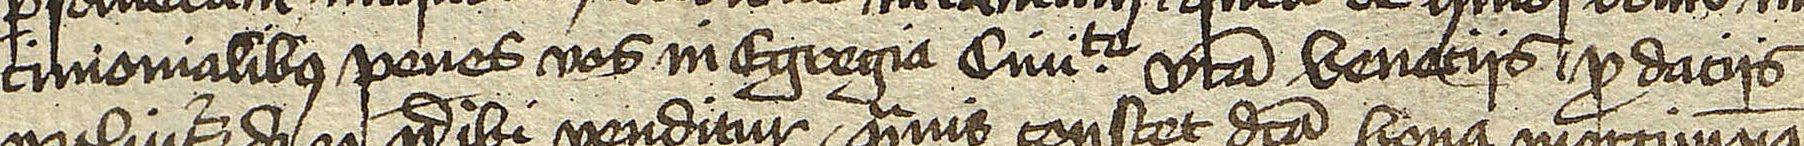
cimionialib* penes nos in Egregia Ciui*te . v*ra Venetiis / p* daciis
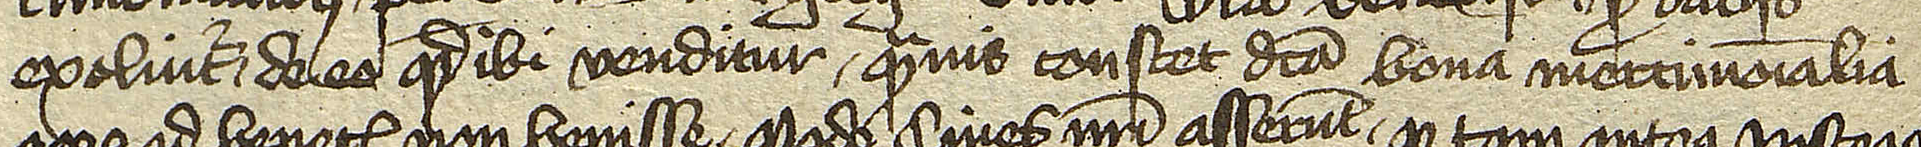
exoluit* de eo q*d ibi venditur / q*vis conſtet d*ta bona mercimo*alia
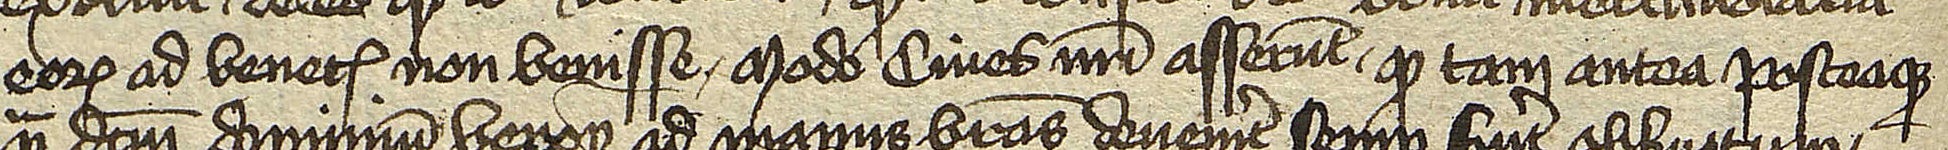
eo* ad Venet* non veniſſe / Modo Ciues n*ri aſſer*nt / q* tam antea poſteaq*
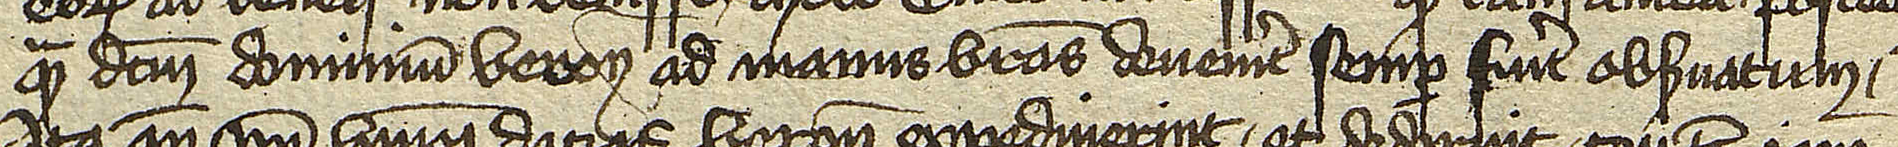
q* d*t*m dominiu* Veron* ad manus v*ras deuen*it ſemp* fu*it obſ*uatum
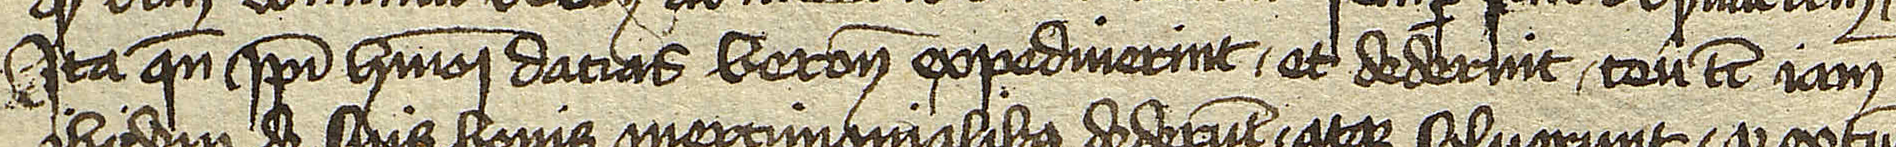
Ita q*n* Ip*i h*mo*i dacias Veron* expediuerint / et dederint / ceu t*c iam
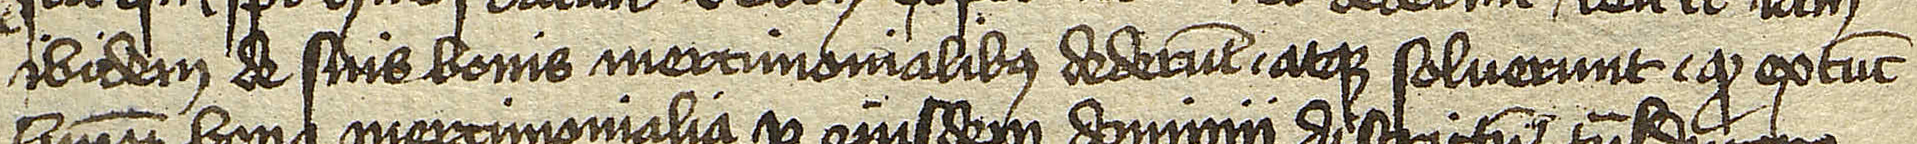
ibidem de ſuis bonis mercimonialib* dederu*t / atq* ſoluerunt / q* extu*c
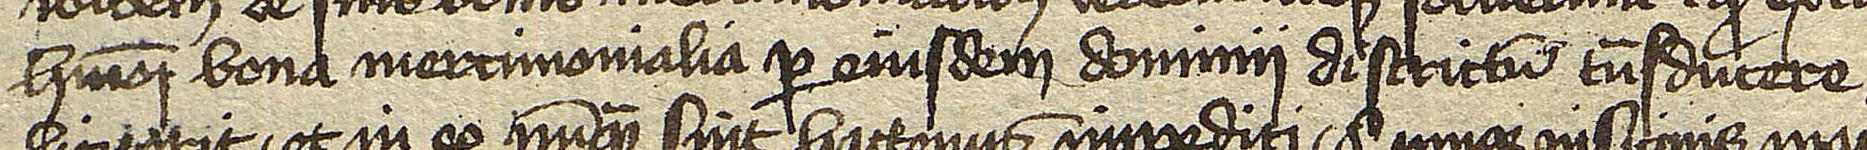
h*mo*i bona mercimonialia p* eiuſdem dominii diſtrictu* t*nſducere
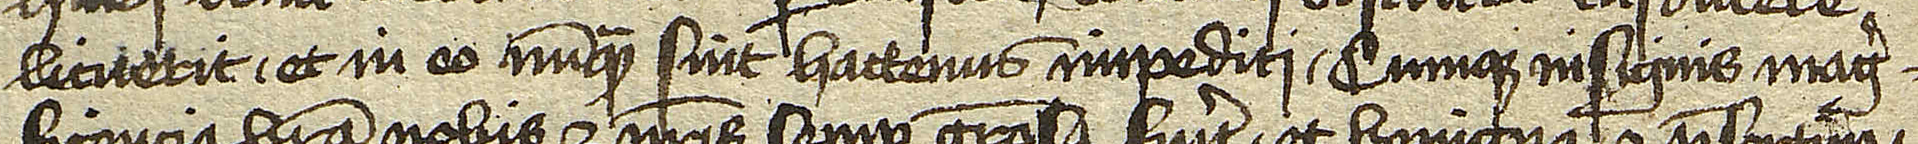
licuerit / et in eo nu*q* ſint hactenus impediti / Cumq* inſignis mag* =
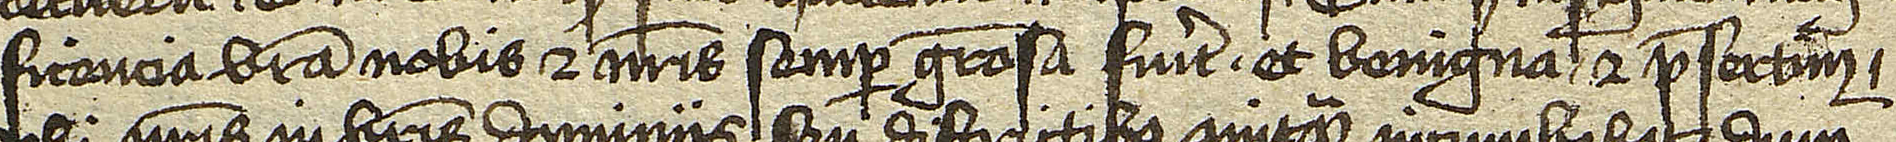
ficencia v*ra nobis @ n*ris ſemp* g*r*oſa fu*it / et benigna / @ p*ſertim /
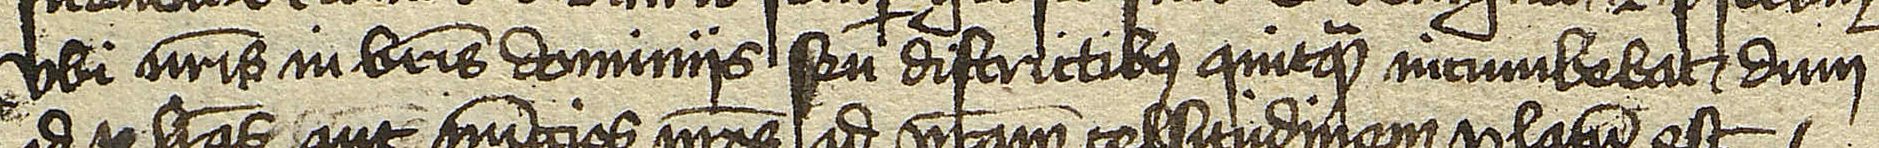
vbi n*ris in v*ris dominiis ſeu diſtrictib* quicq* incumbebat* / dum
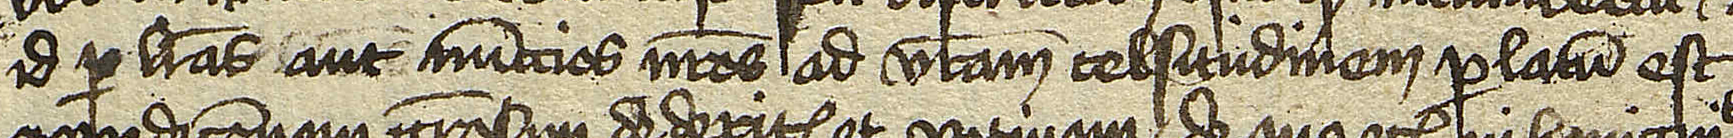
id p* v*ras aut nu*cios n*ros ad v*ram celſitudinem p*lat* eſt
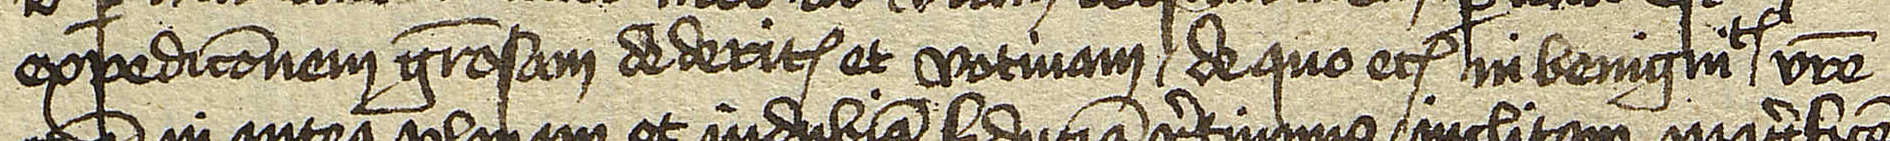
expedic*onem gr*oſam dederit* et votivam / de quo et* in benigni*t* / v*re
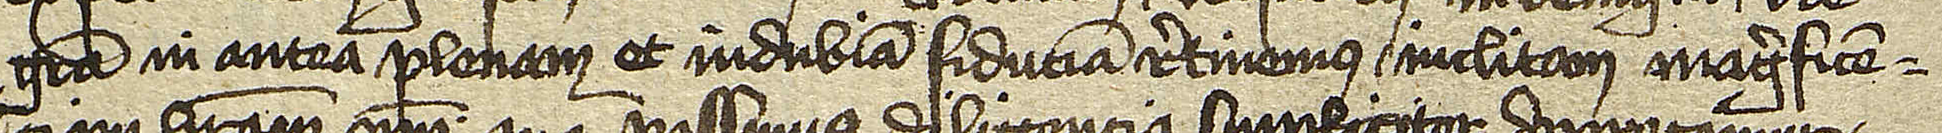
gr*a in antea plenam et indubia* fiducia* r*tinem* / inclitam mag*fice =
